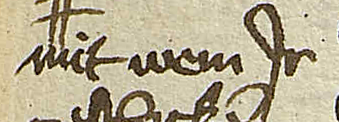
mit wem Ir
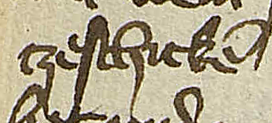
cʒeſchicke*
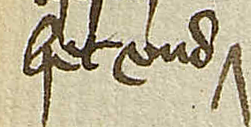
het vnd
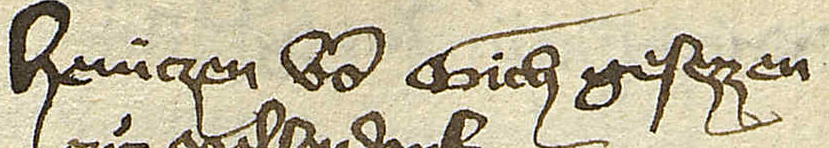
heincʒen vo* Gich geſeʒʒen
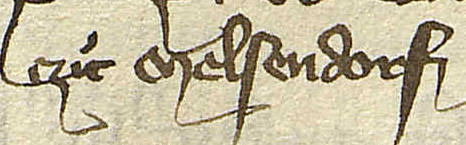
cʒü Melſendorf
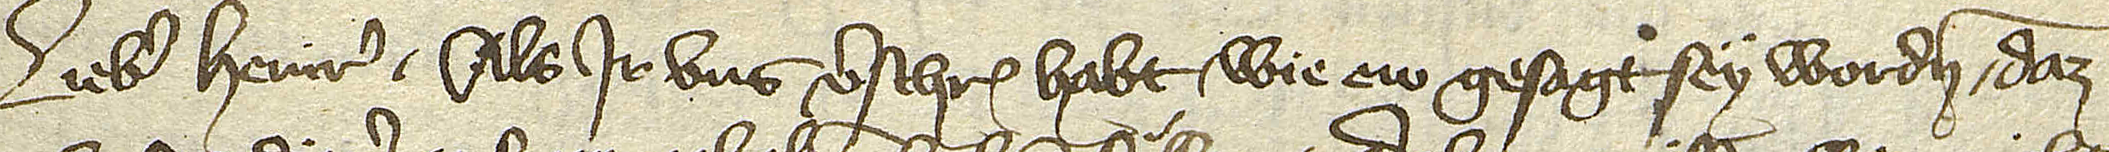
Lieb* heinr* / Als Ir vns v*ſchr* habt / wie ew geſagt ſey worden / daʒ
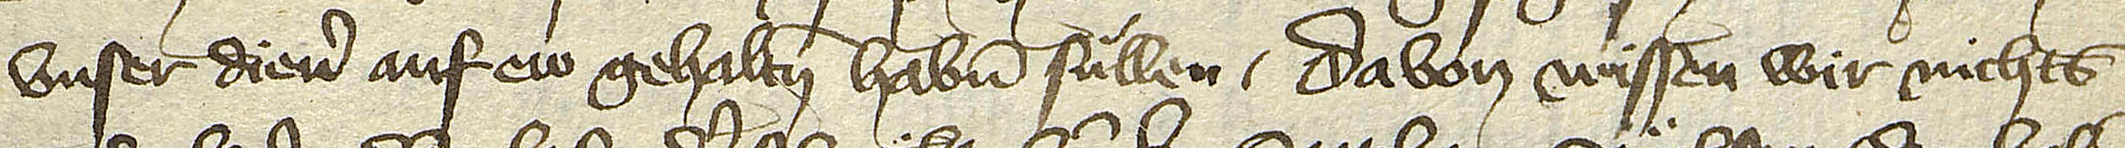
vnſer dien* auf ew gehaltn* habn* ſüllen / Davon wiſſen wir nichts
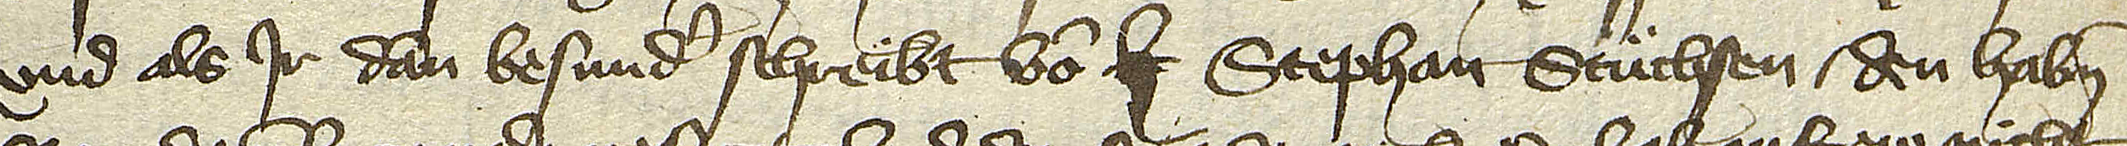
vnd als Ir dan* beſund* ſchreibt vo* h* Stephan Stüchſen / den habn*
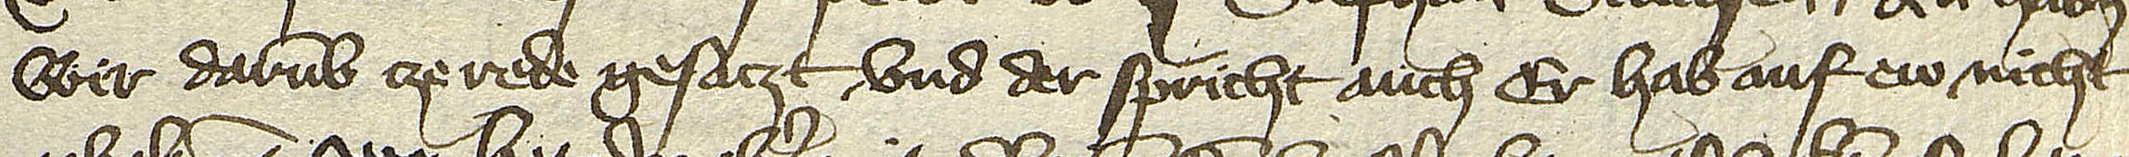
wir darub* cʒe rede geſacʒt / vnd der ſpricht auch Er hab auf ew nicht
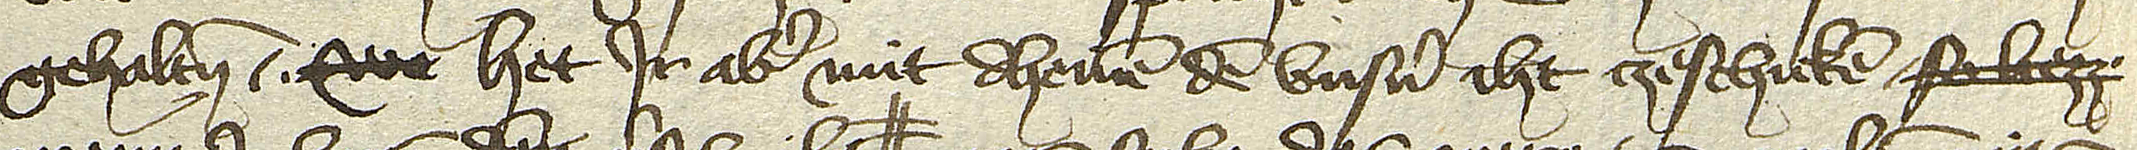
gehaltn* / . we het Ir ab* mit dheine* d* vnſn* iht cʒeſchicke* / ſo lieʒʒe
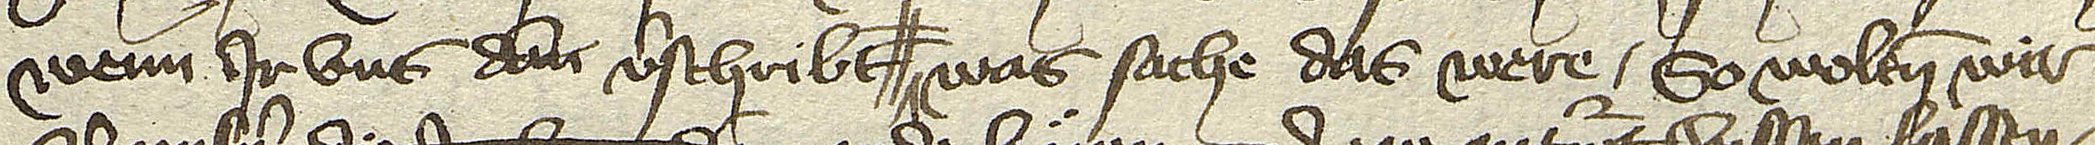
wenn Ir vns dan* v*ſchribt was ſache das were / So woltn* wir
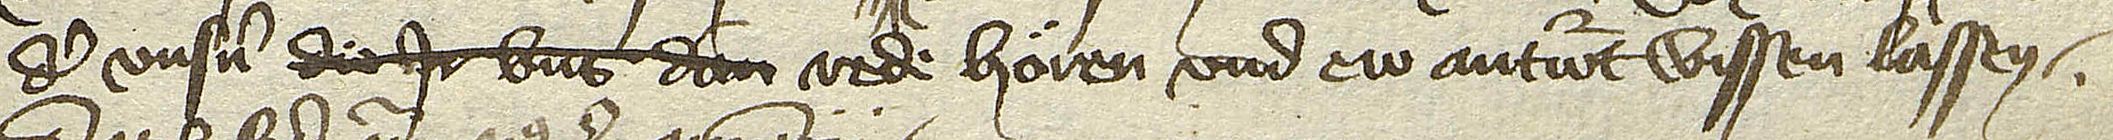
d* vnſn* die Ir vns dan* rede hören vnd ew antwt* wiſſen laſſen / .
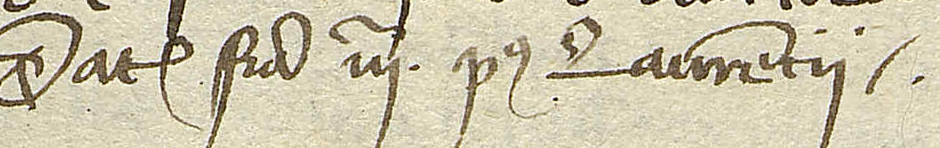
Dat* fia* iii* . p* Laure*cii / .
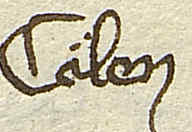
Cölen
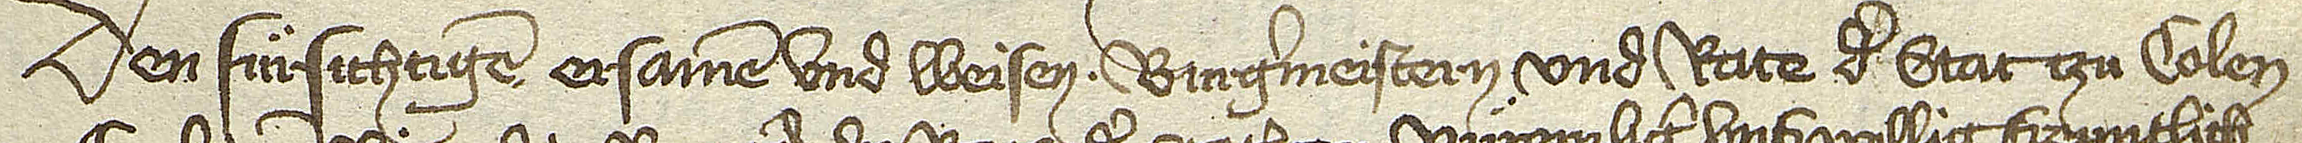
Den fürſichtige* erſame* vnd weiſen . Burg*meiſtern vnd Rate d* Stat cʒu Colen
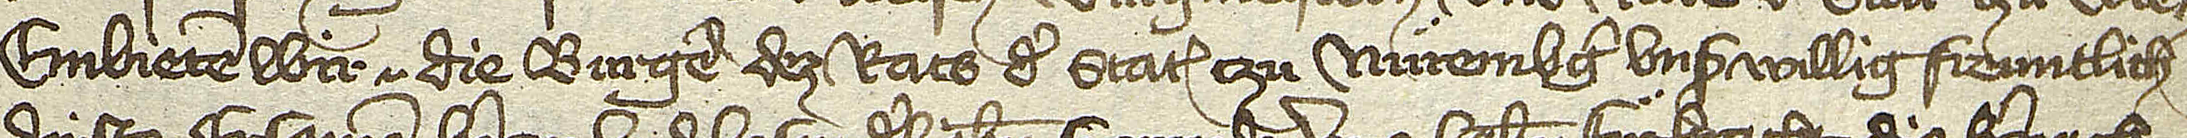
Embiete* wir ~ die Burge* deʒ Rats d* Stat* cʒu Nürembg* vnſ* willig freuntlich
